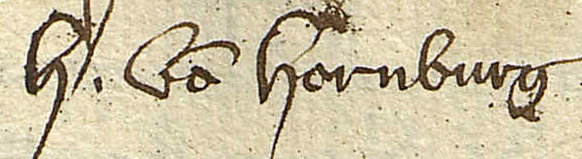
h*. vo* Hornburg
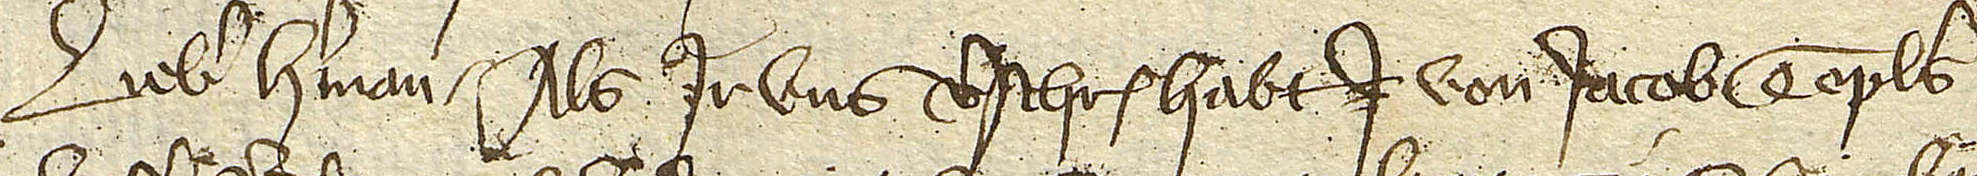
Lieb* h*man / Als Ir vns v*ſchr* habt I von Iacob Tepls*
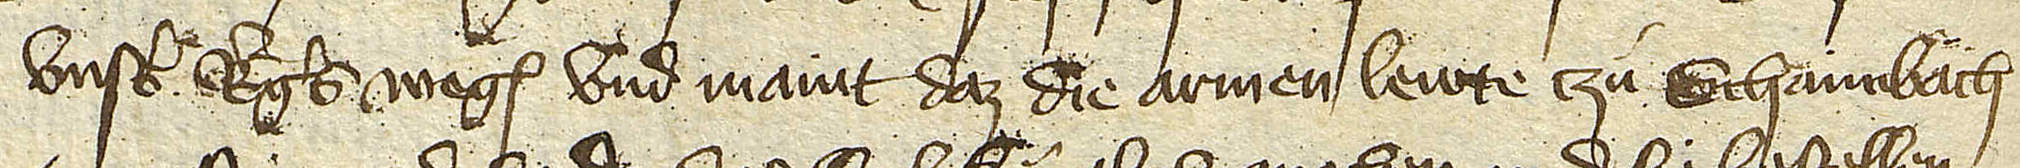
vnſs* B*g*s weg* vnd maint daʒ die armen lewte cʒü Schaimbach
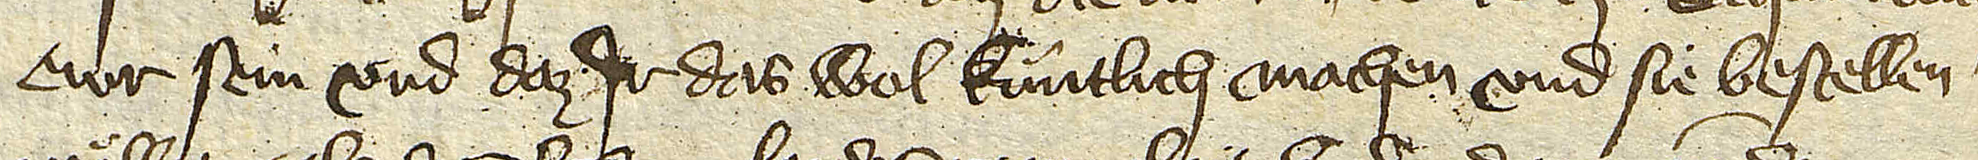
ewr ſein vnd daʒ Ir das wol küntlich machen vnd ſie beſtellen
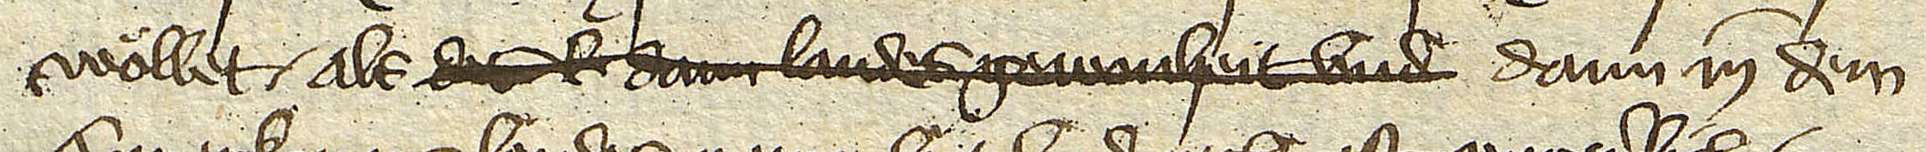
wöllet / als des % dann landes gewonheit vnd dann in dem
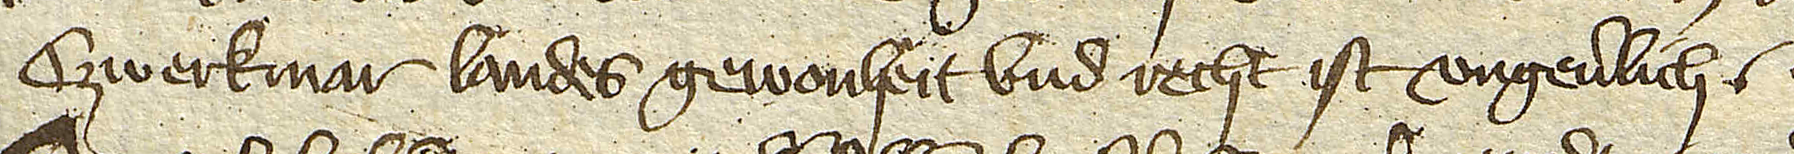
Cʒwekmar landes gewonheit vnd recht iſt vngeu*lich / .
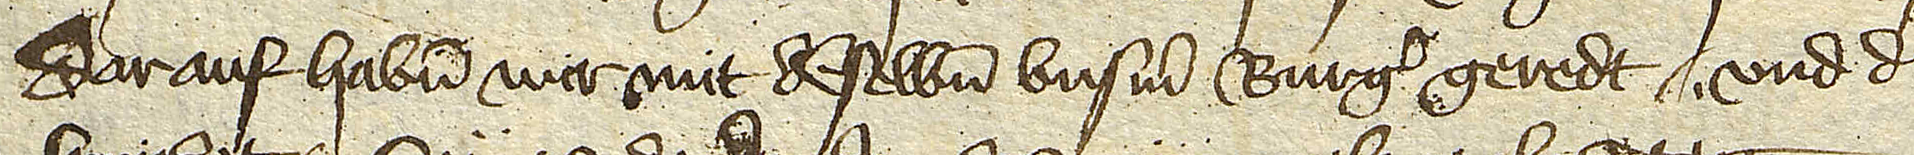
Darauf habn* wir mit de*ſelbn* vnſm* Burg* geredt / . vnd d*
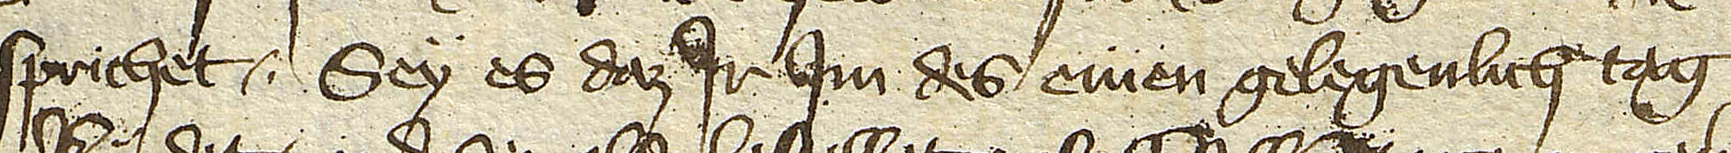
ſprichet / . Sey es daʒ Ir Im des einen gelegenlich tag
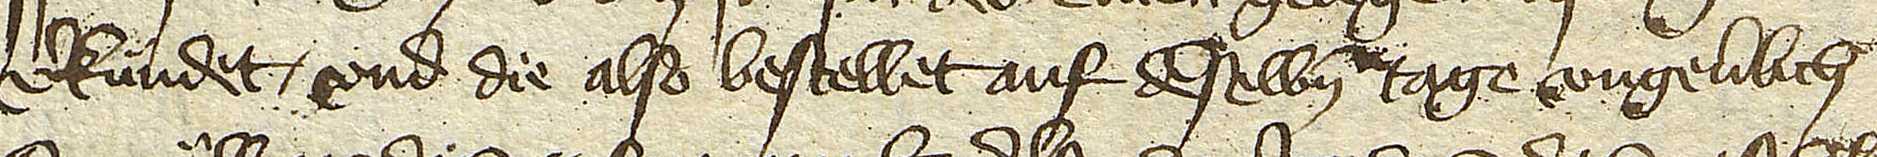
v*kündet / vnd die alſo beſtellet auf d*ſelbn* tage vngeu*lich
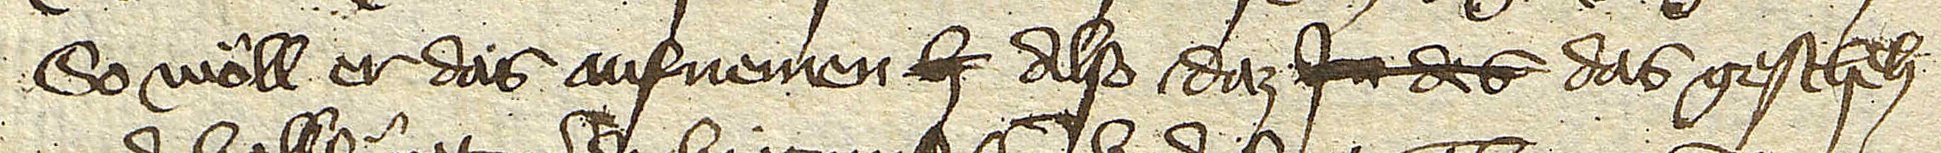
So wöll er das aufnemen h Alſo / daʒ Im des das geſcheh
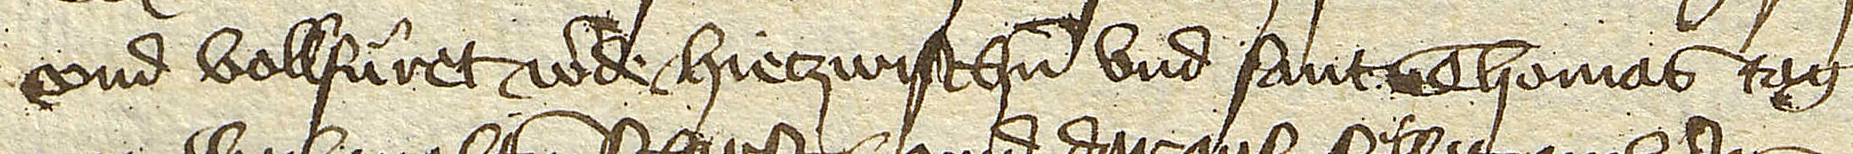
vnd vollfüret w*de hiecʒwiſchn* vnd ſant Thomas tag
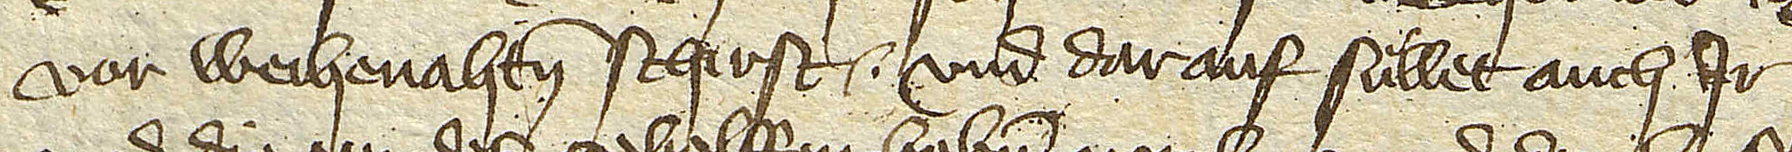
vor weihnahtn* ſchirſt / . vnd darauf ſüllet auch Ir
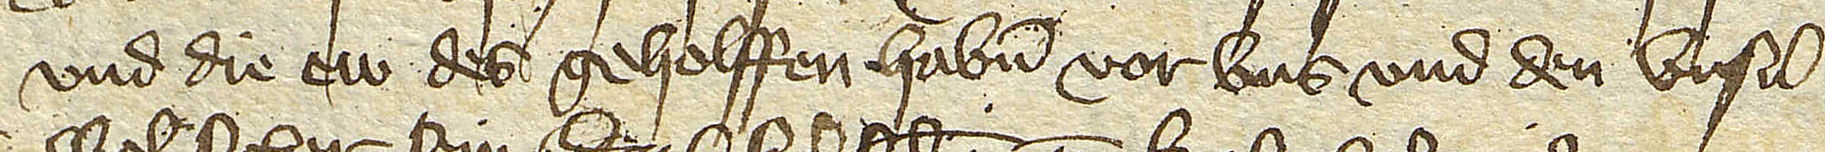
vnd die ew des geholffen habn* vor vns vnd den vnſn*
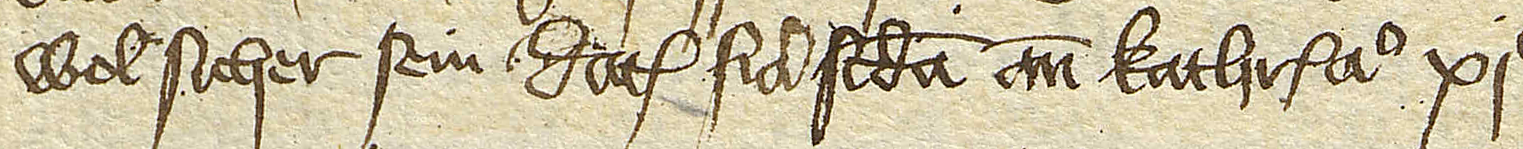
wol ſicher ſein Dat* fia* ſcda* an* kathr* a* xi*
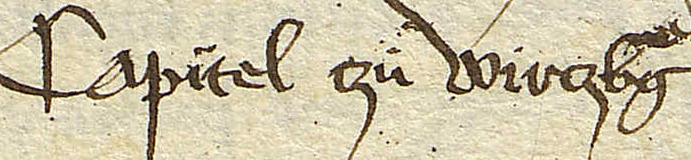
Capitel cʒu Wircʒb*g
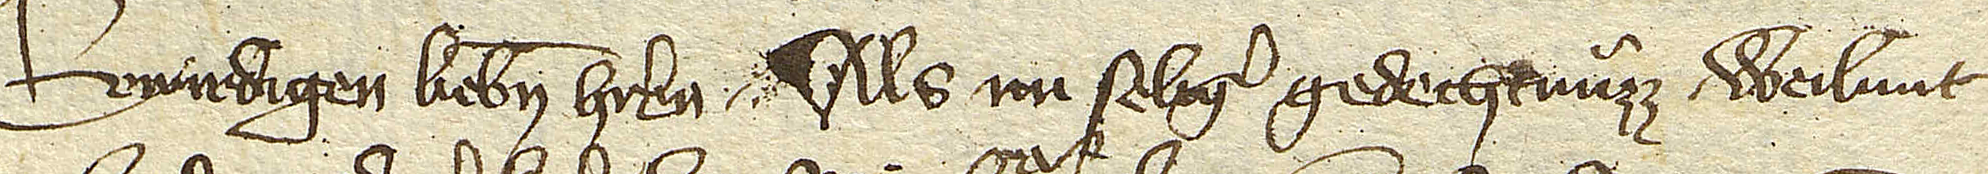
Erwirdigen liebn* hr*en / Als nu ſelig* gedechtnüʒʒ / Weilunt
